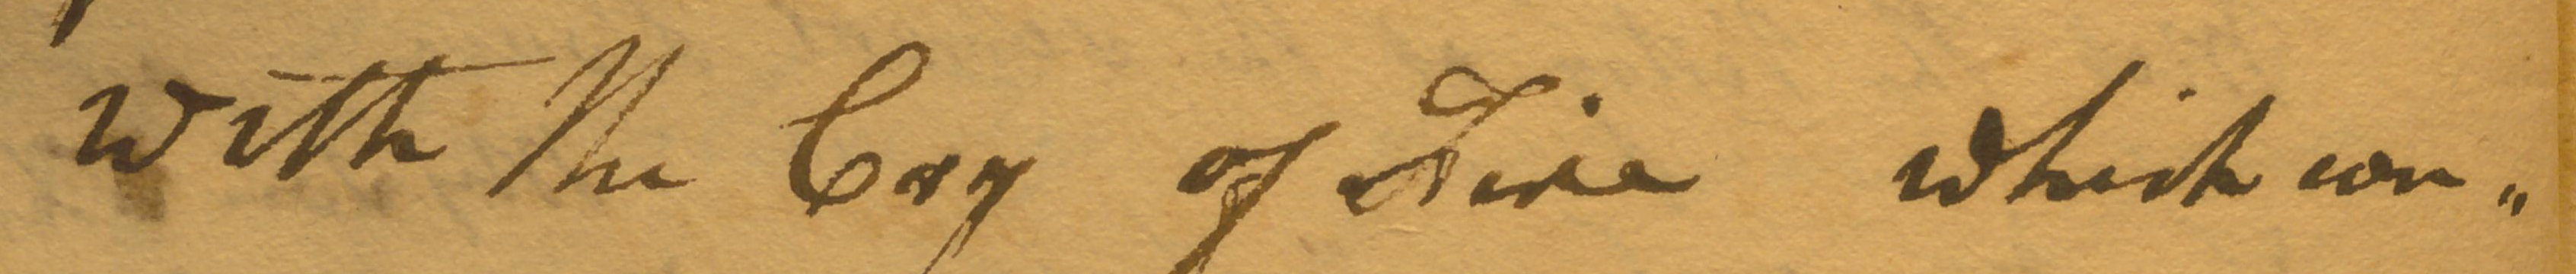with the Cry of Fire which con.
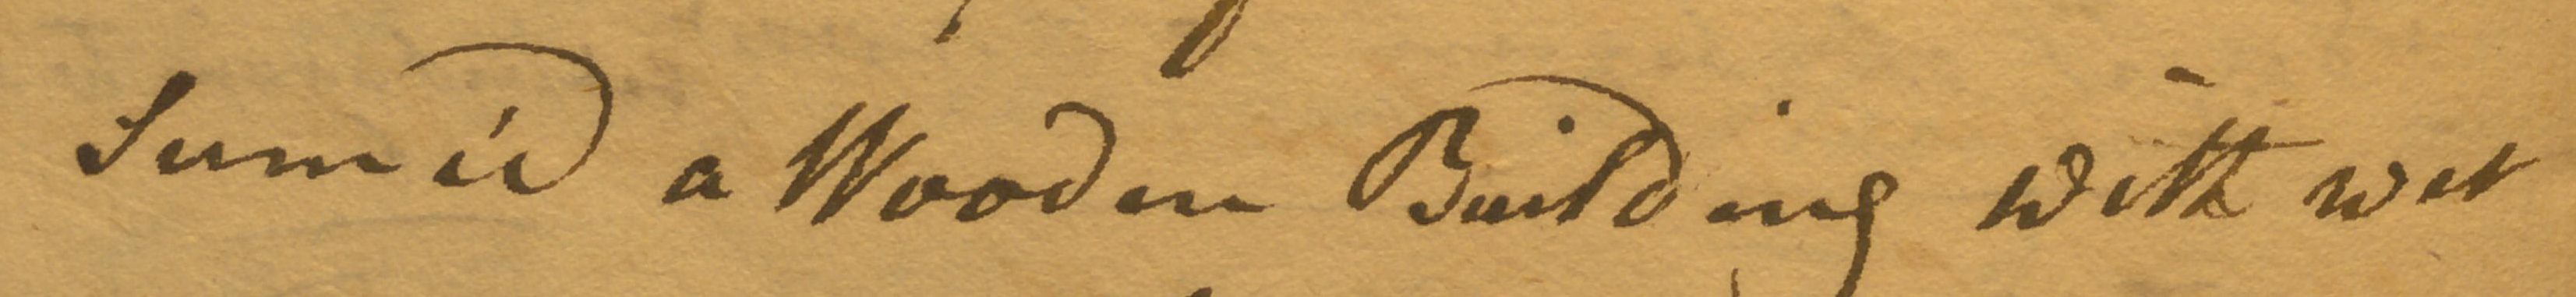sume'd a Wooden Building with wet
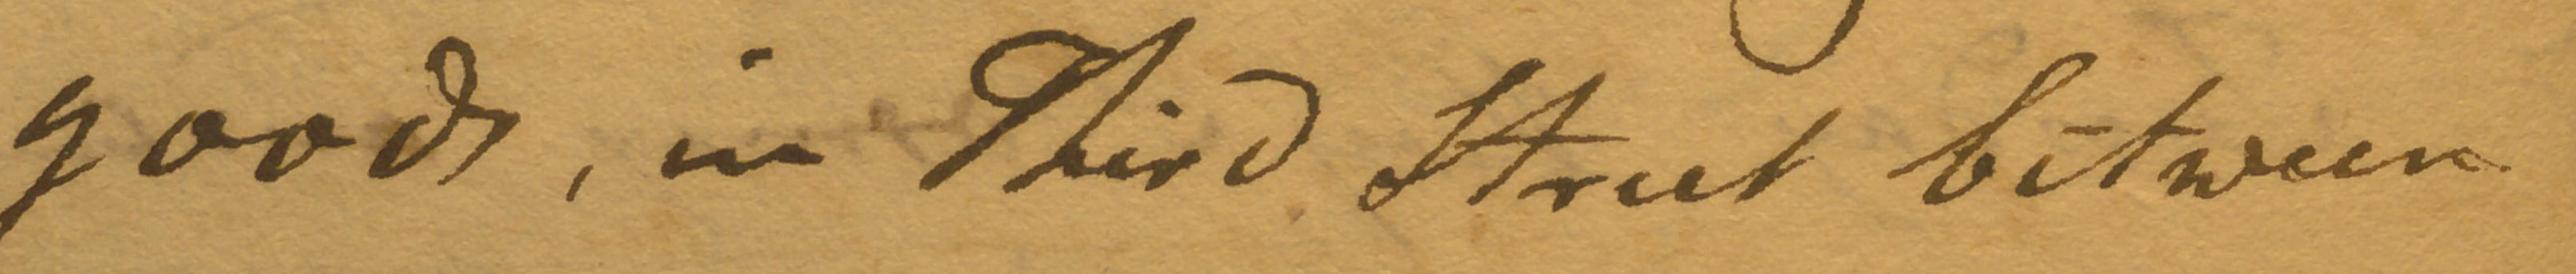goods, in Third Street between
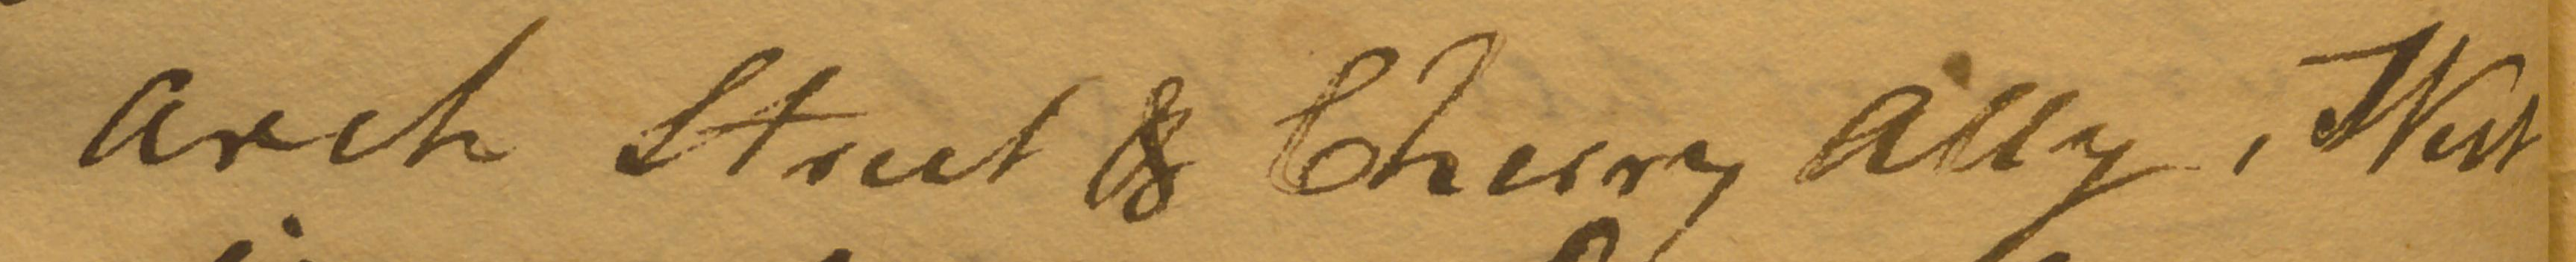Arch Street & Cherry Ally, West
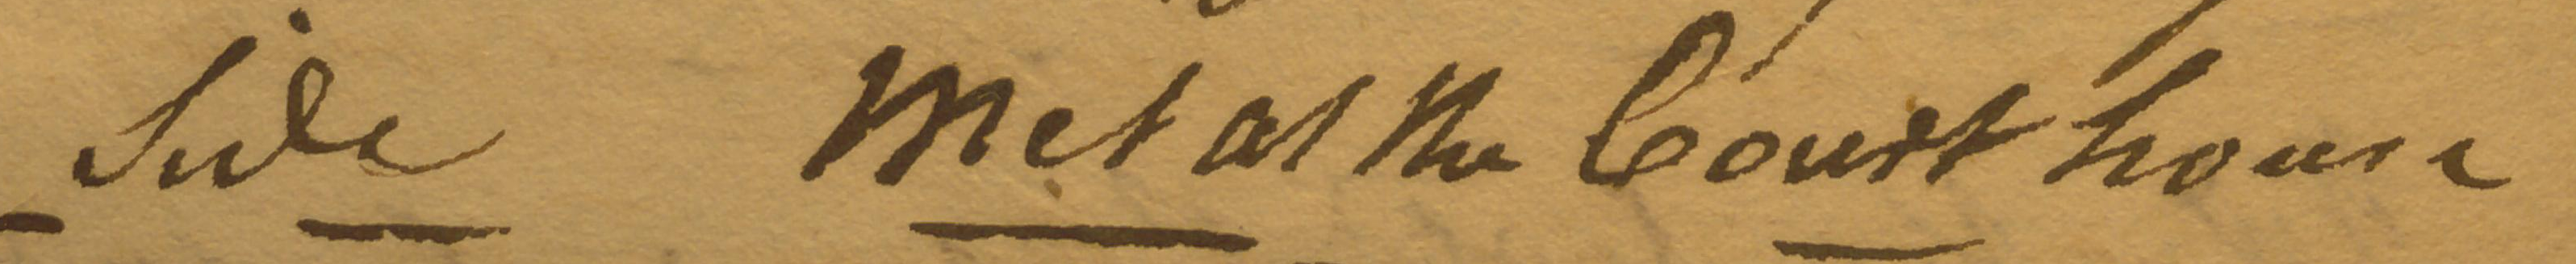side Met at the Courthouse
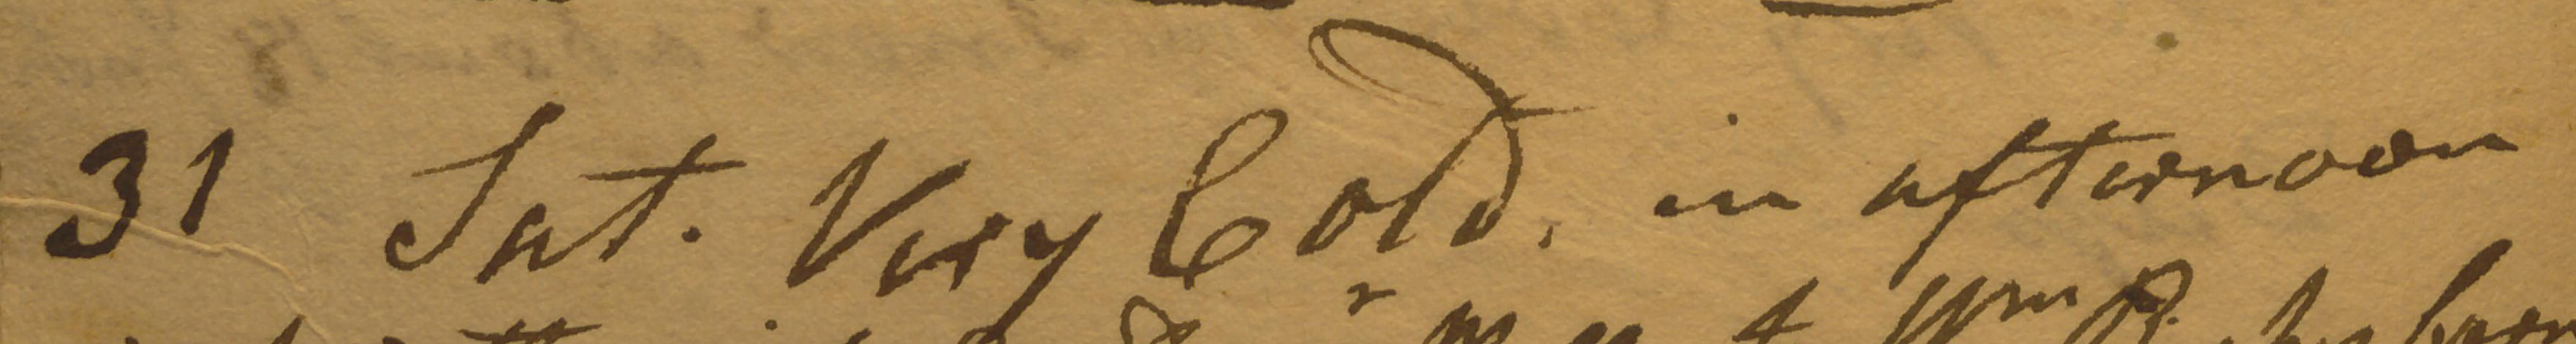31 Sat. Very Cold. in afternoon
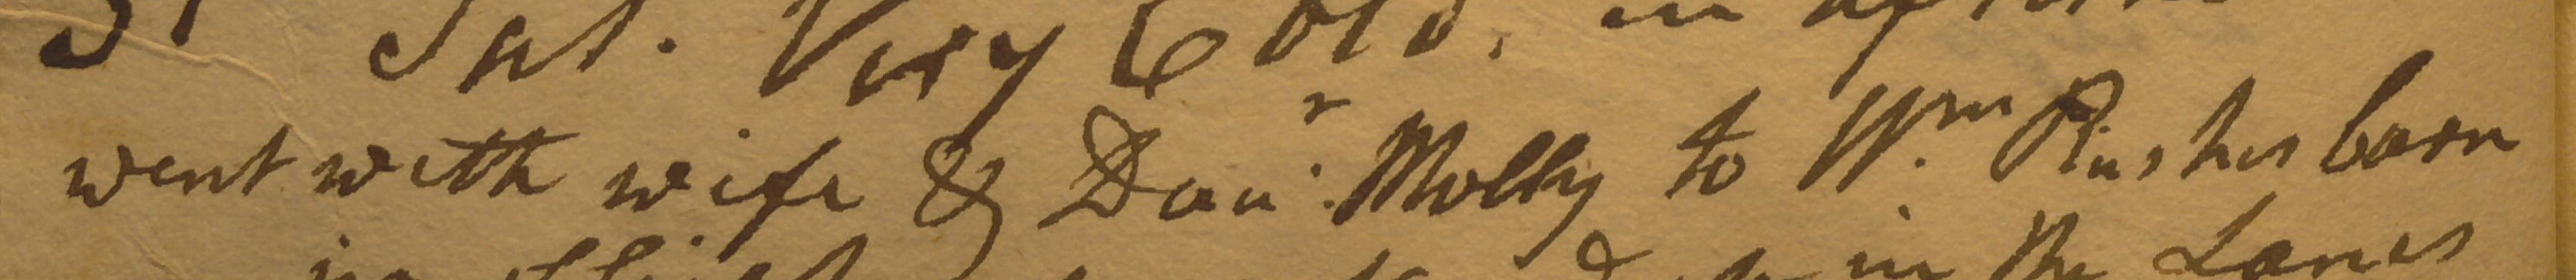went with wife & Dau^r: Molly to W^m. Rushes barn
